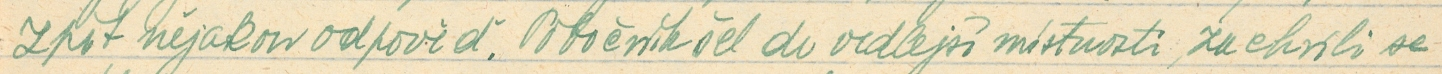zpět nějakou odpověď. Pobočník šel do vedlejší místnosti, za chvíli se
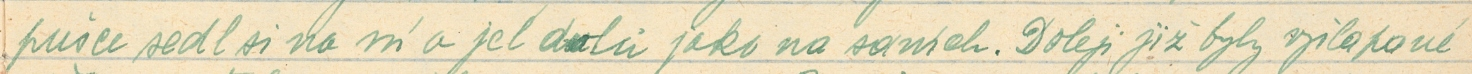pušce sedl si na ní a jel dolů jako na saních. Doleji již byly vyšlapané
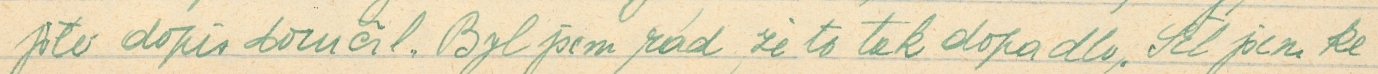jste dopis doručil. Byl jsem rád že to tak dopadlo. Šel jsem ke
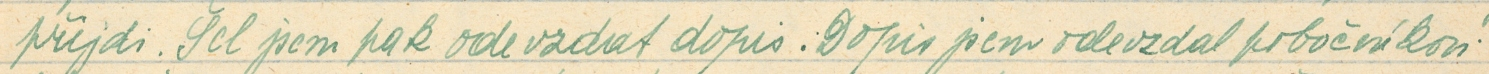přijdi. Šel jsem pak odevzdat dopis. Dopis jsem odevzdal pobočníkovi
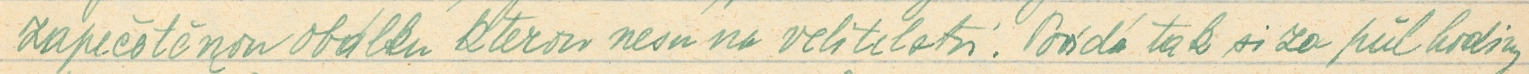zapečetěnou obálku kterou nesu na velitelství. Povídá tak si za půl hodiny
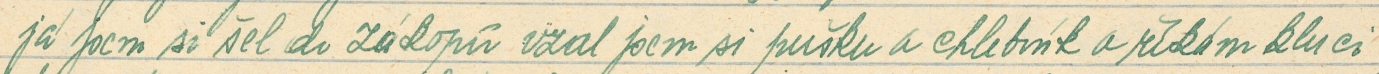já jsem si šel do zákopů vzal jsem si pušku a chlebník a říkám kluci
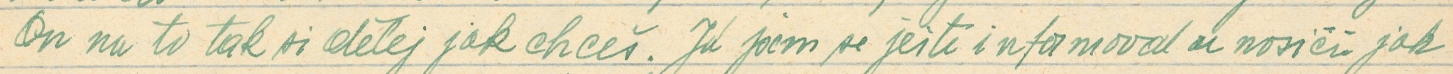On na to tak si dělej jak chceš. Já jsem se ještě informoval u nosičů jak
